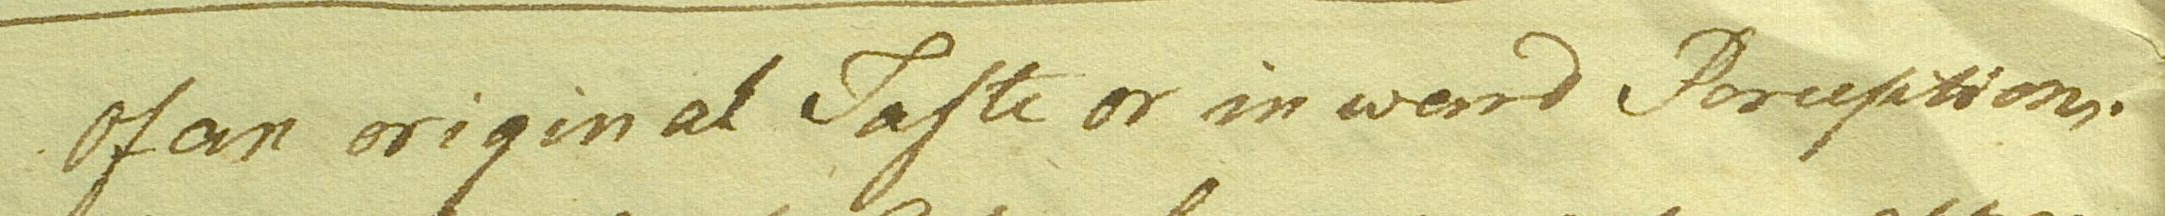of an original Taste or inward Perceptions.
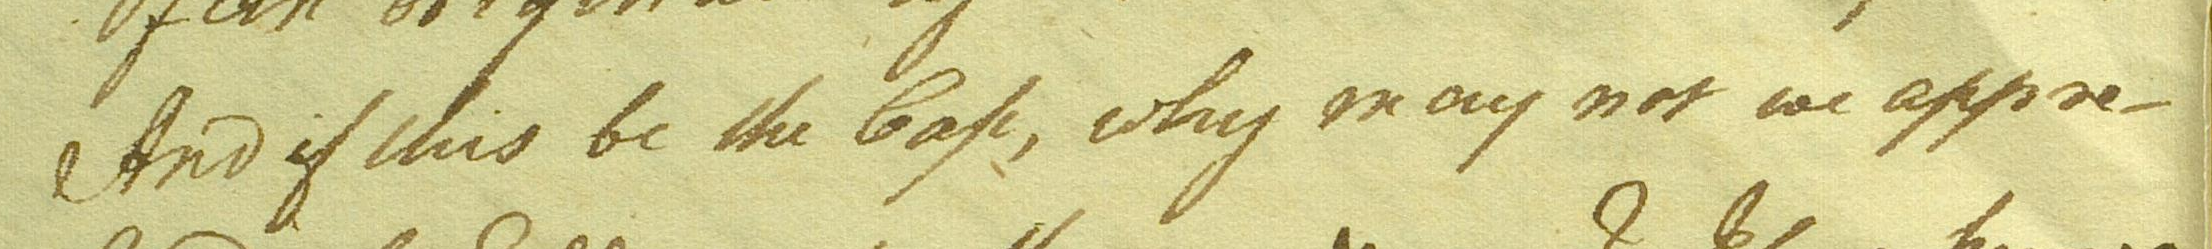And if this be the Case, why may not we appre-
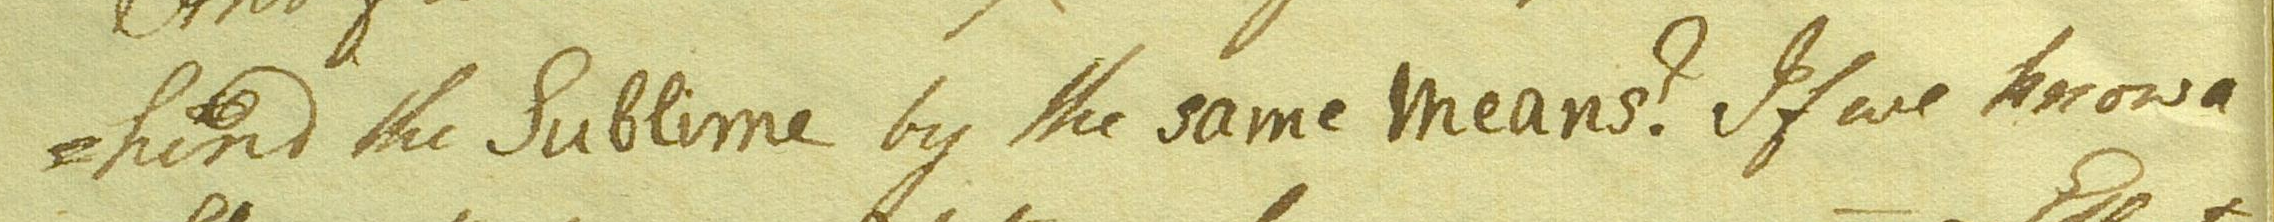-hend the Sublime by the same means? If we know a
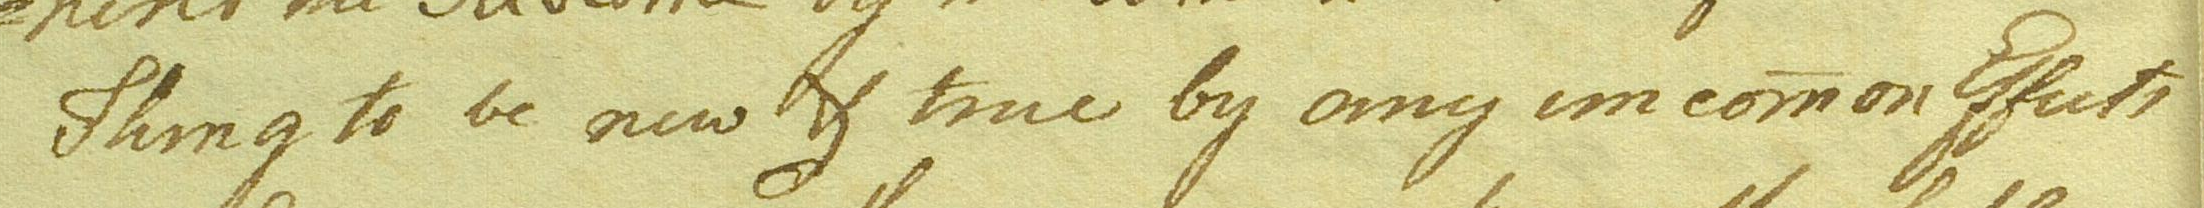Thing to be new & true by any uncom̄on Effects
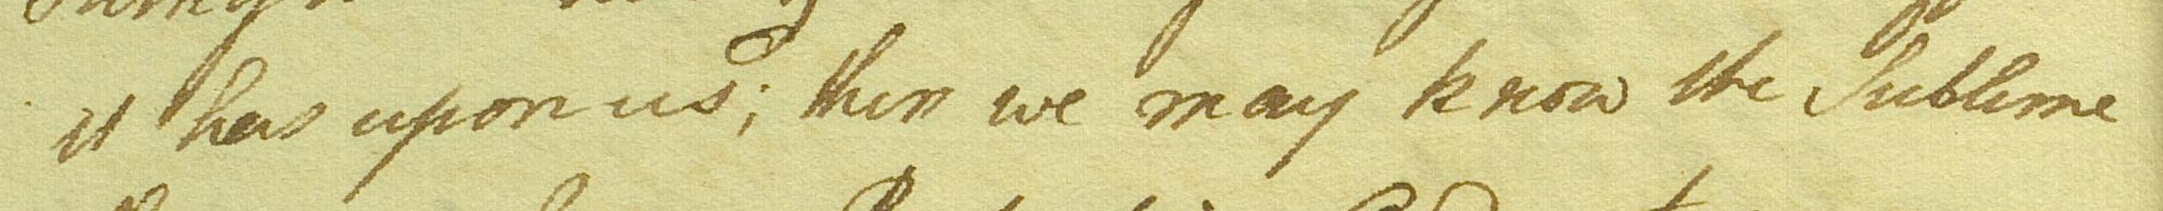it has upon us; then we may know the Sublime
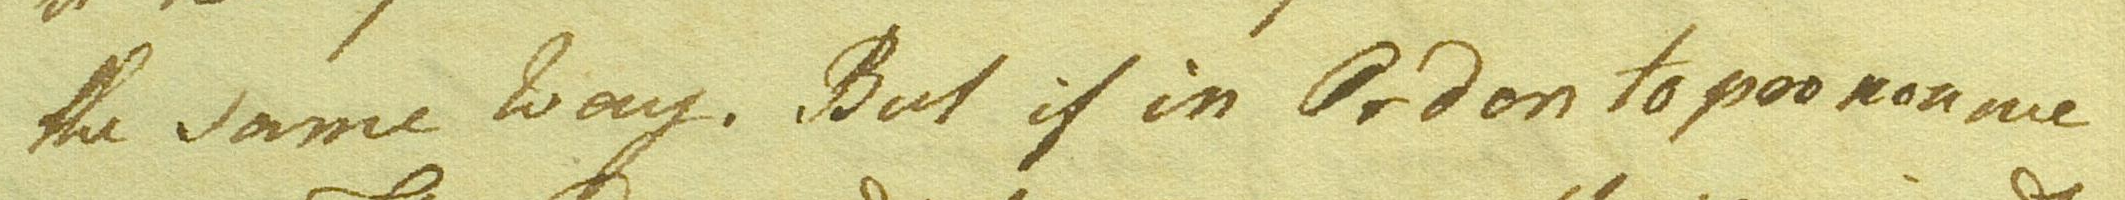the same way. But if in Order to pronounce
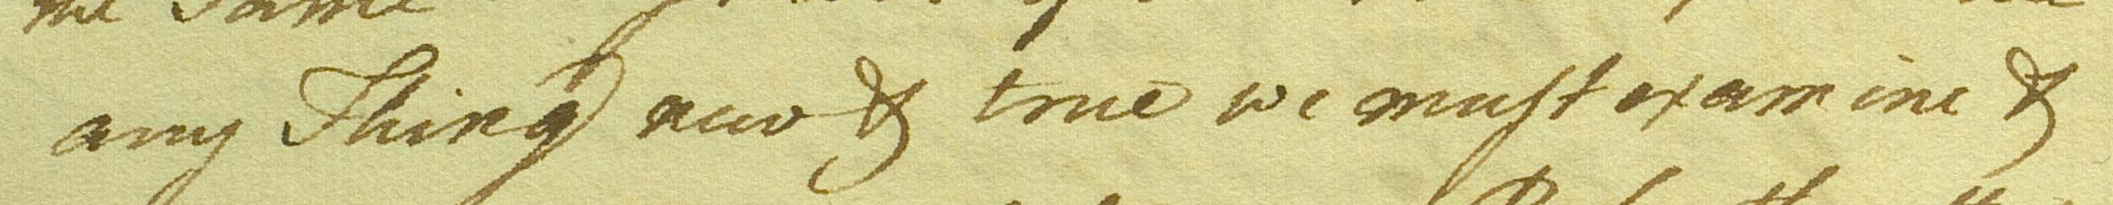any Thing new & true we must examine &
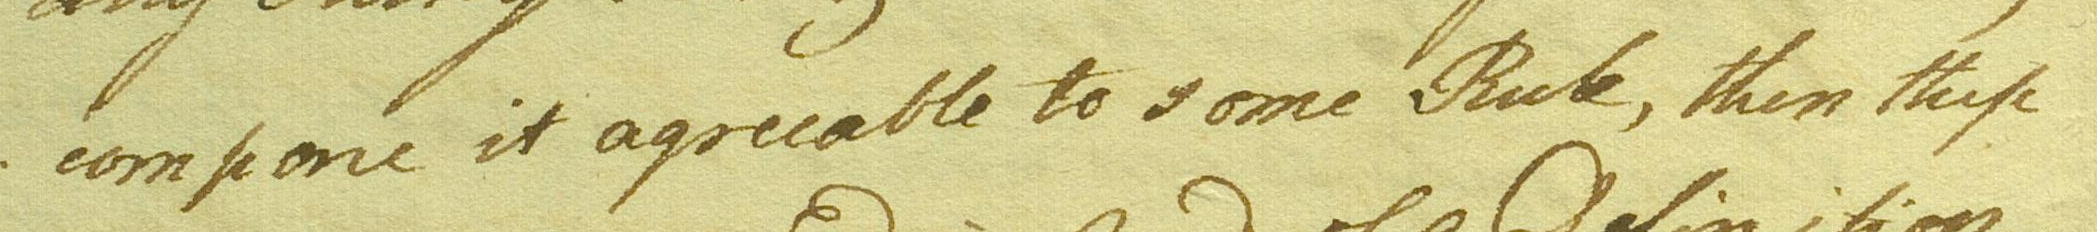compose it agreeable to some Rule, then these
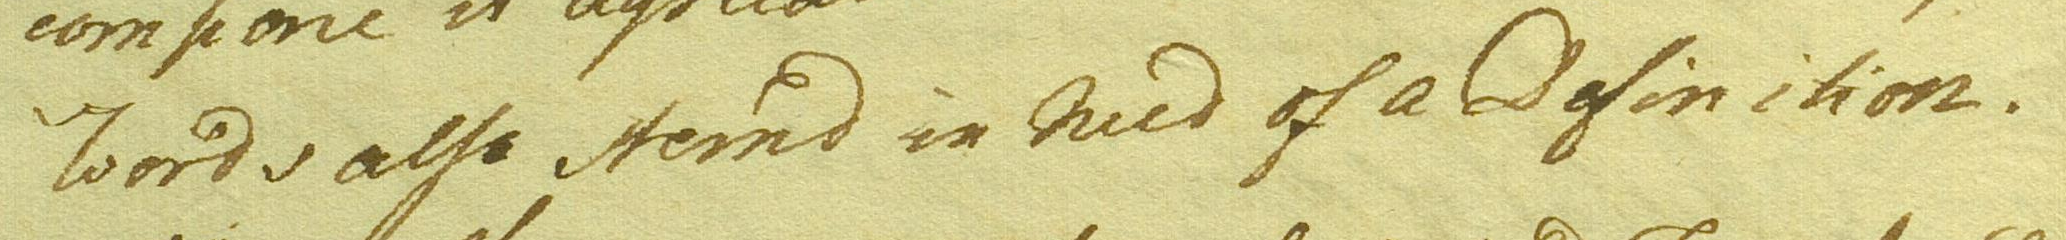Words also stand in need of a Definition.
